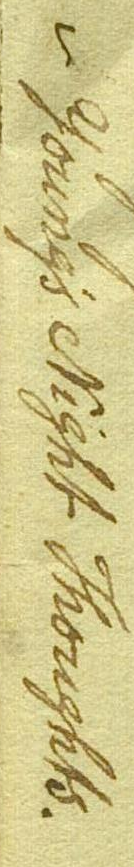- Young's Night Thoughts.
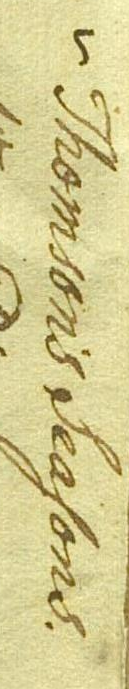- Thomson's Seasons.
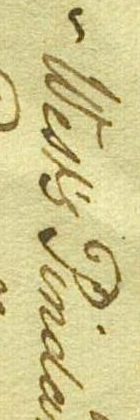- West's Pindar
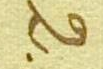2.
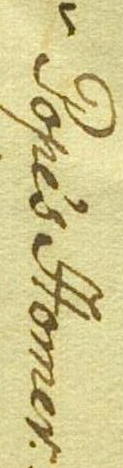- Pope's Homer.
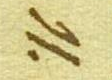11.
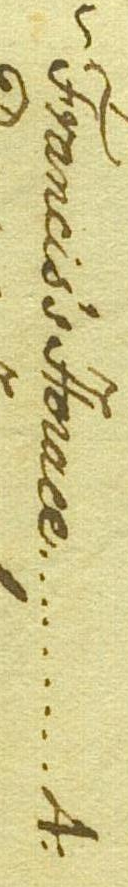- Francis's Horace.........4.
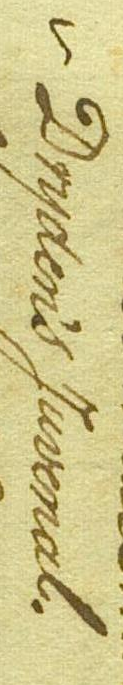- Dryden's Juvenal.
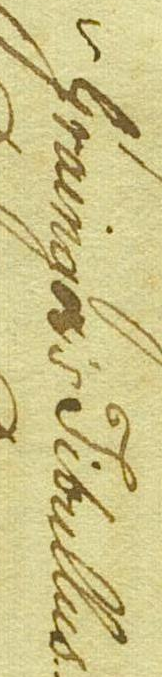- Grainger's Tibullus
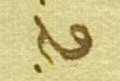2.
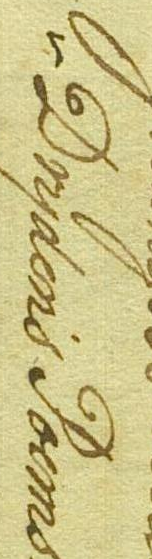- Dryden's Poems
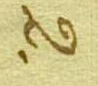2.
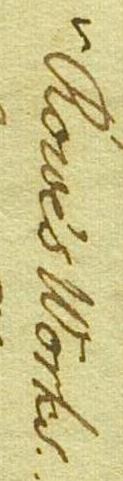- Rowe's Works
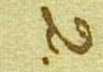2.
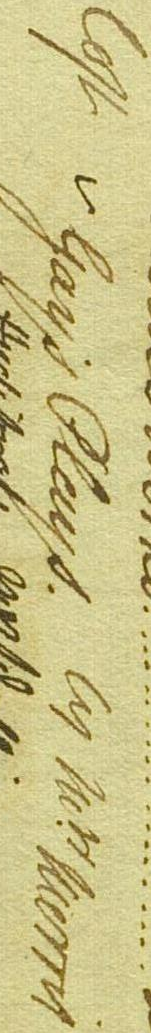Cop - Gay's Plays. As M^r. Merry
